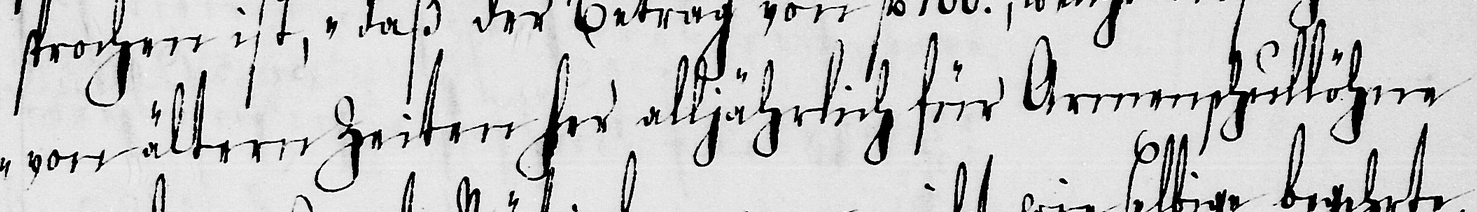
von ältern Zeiten her alljährlich für Armenschullöhne
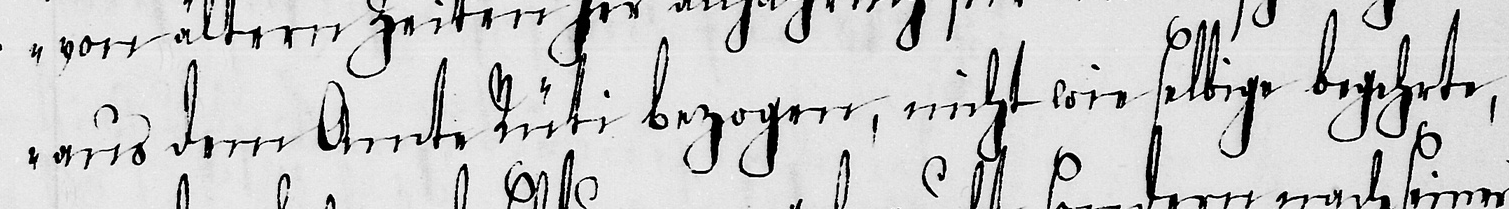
aus dem Amte Rüti bezogen, nicht wie selbige begehrte,
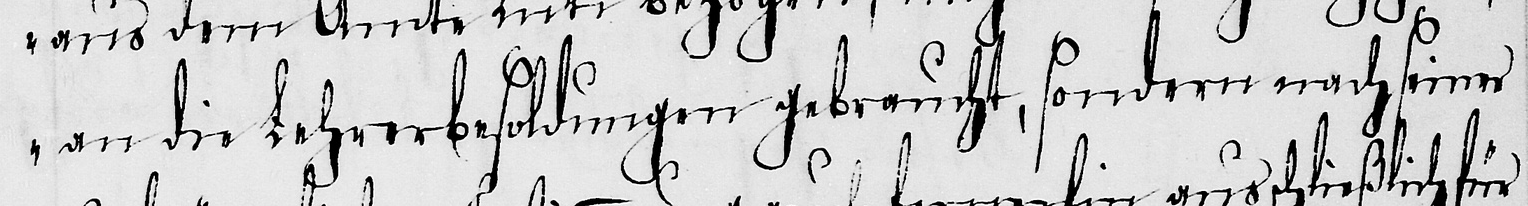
an die Lehrerbesoldungen gebraucht, sondern nach sein¬
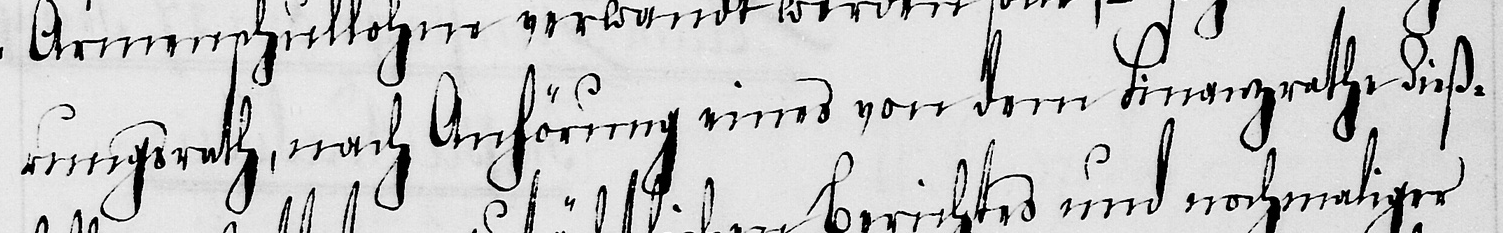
rungsrath, nach Anhörung eines von dem Finanzrathe dies¬
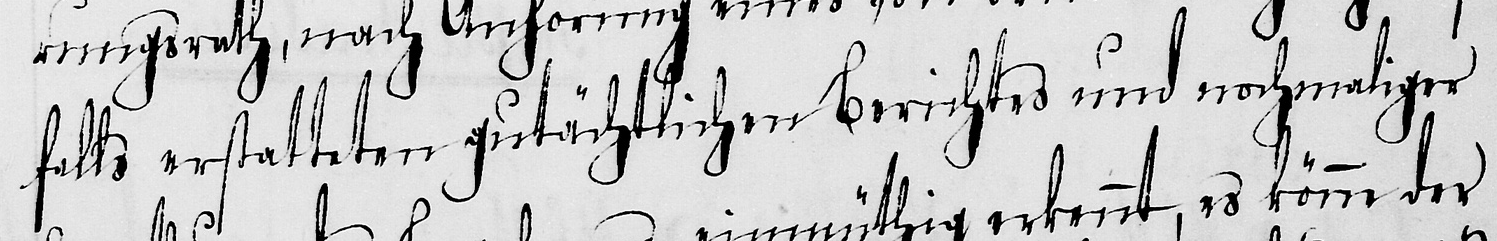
falls erstatteten gutächtlichen Berichtes und nochmaliger
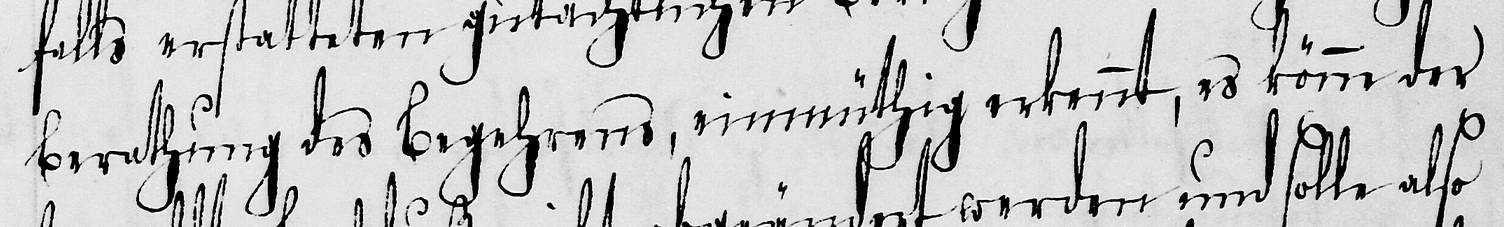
Berathung des Begehrens, einmüthig erkennt, es könne der
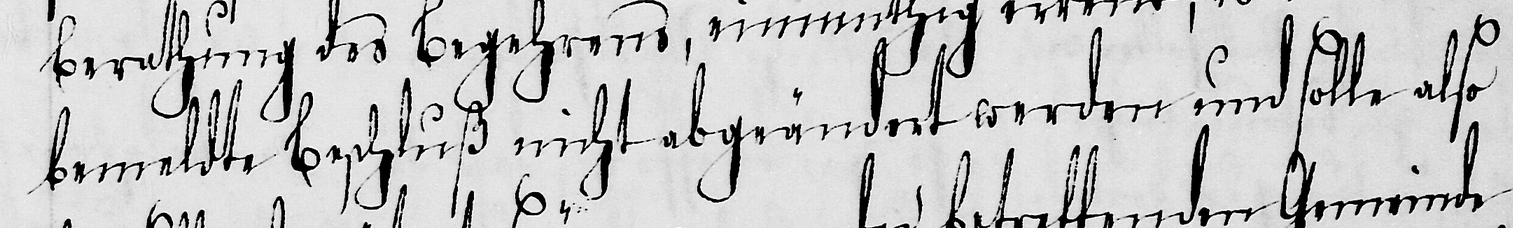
bemeldte Beschluß nicht abgeändert werden und solle also
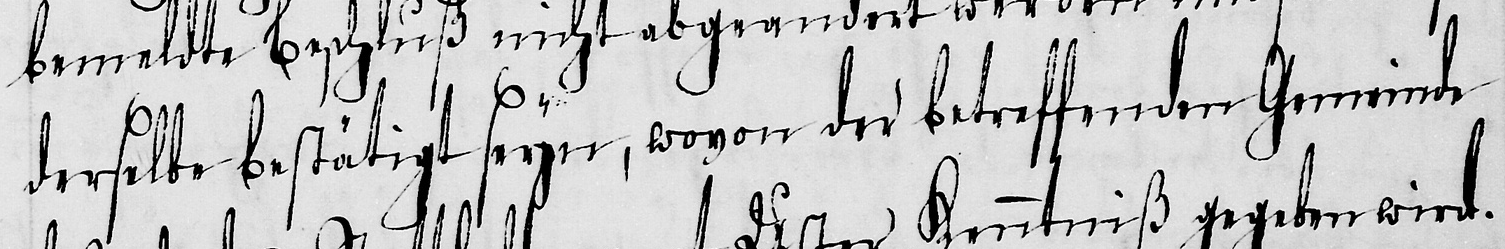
derselbe bestätigt seyn, wovon der betreffenden Gemeinde
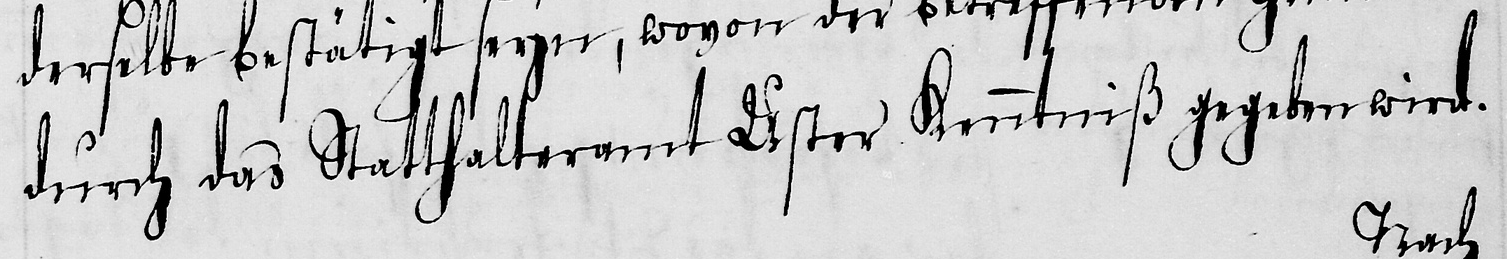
durch das Statthalteramt Uster Kenntniß gegeben wird.
